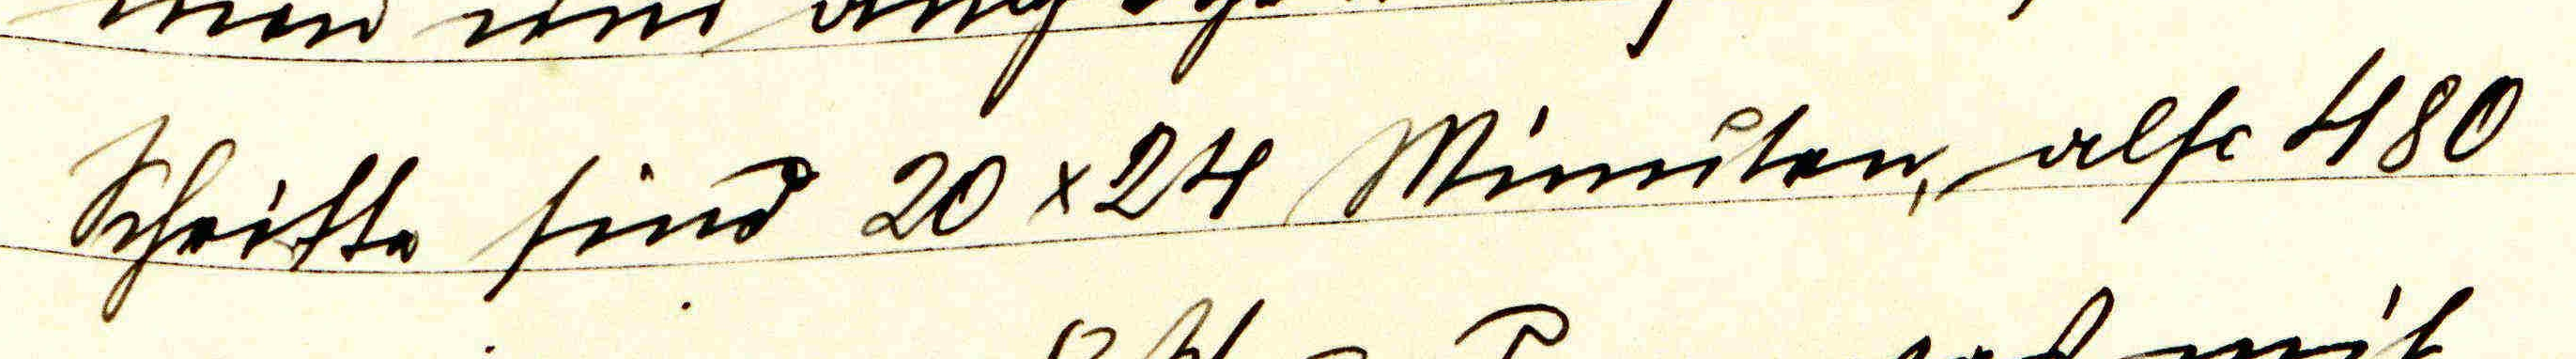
Schritte sind 20 x 24 Minuten also 480
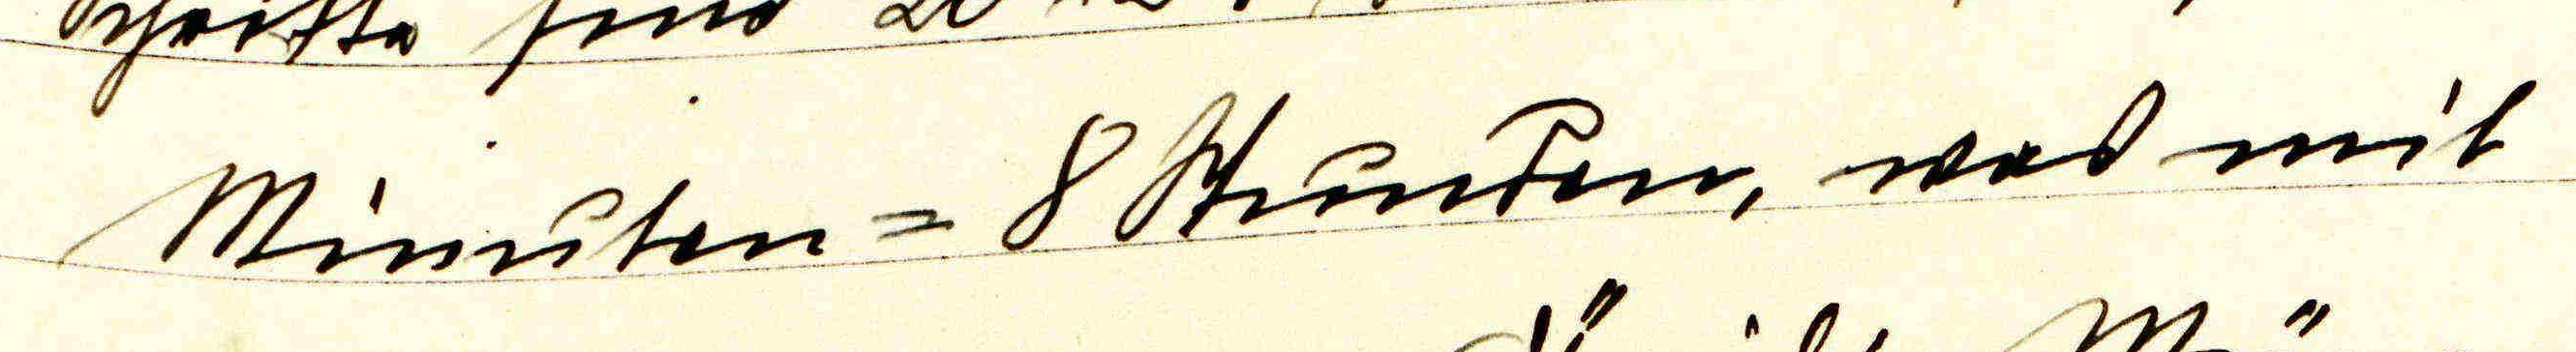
Minuten = 8 Stunden, was mit der
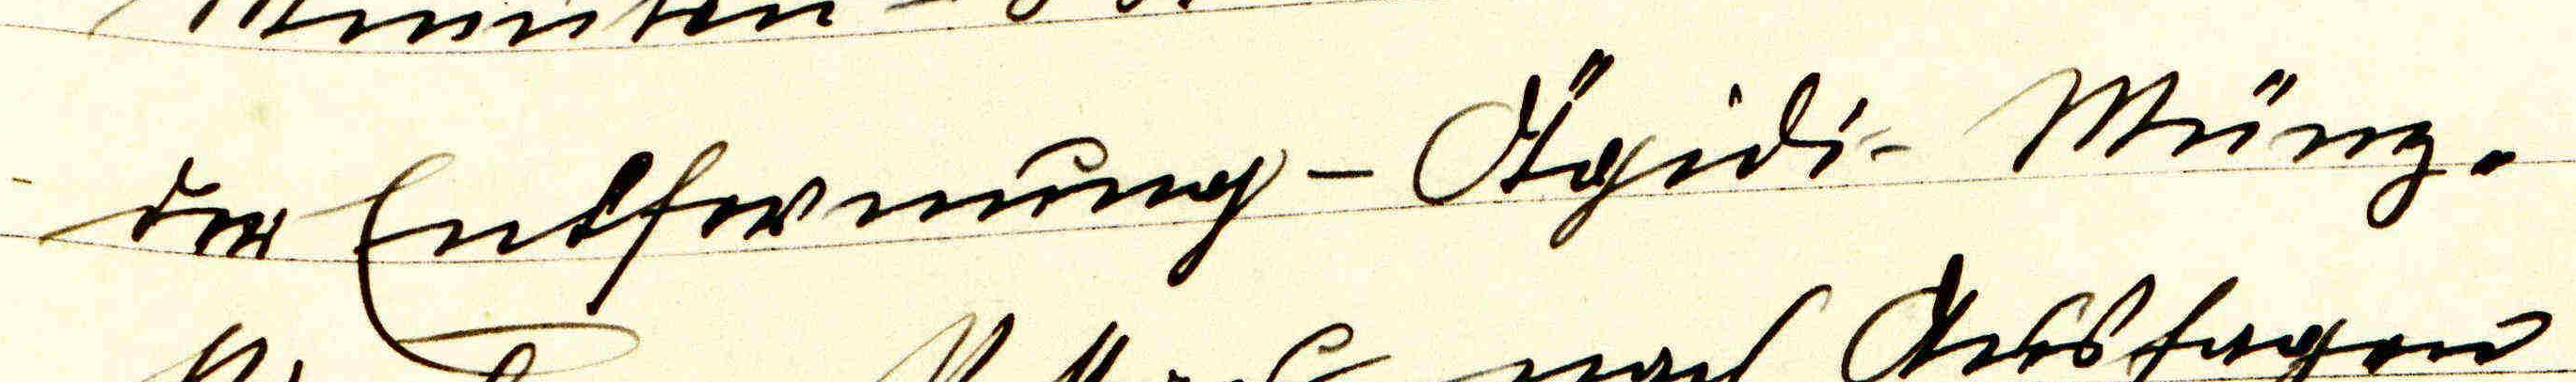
Entfernung – Ägidi – Münz-
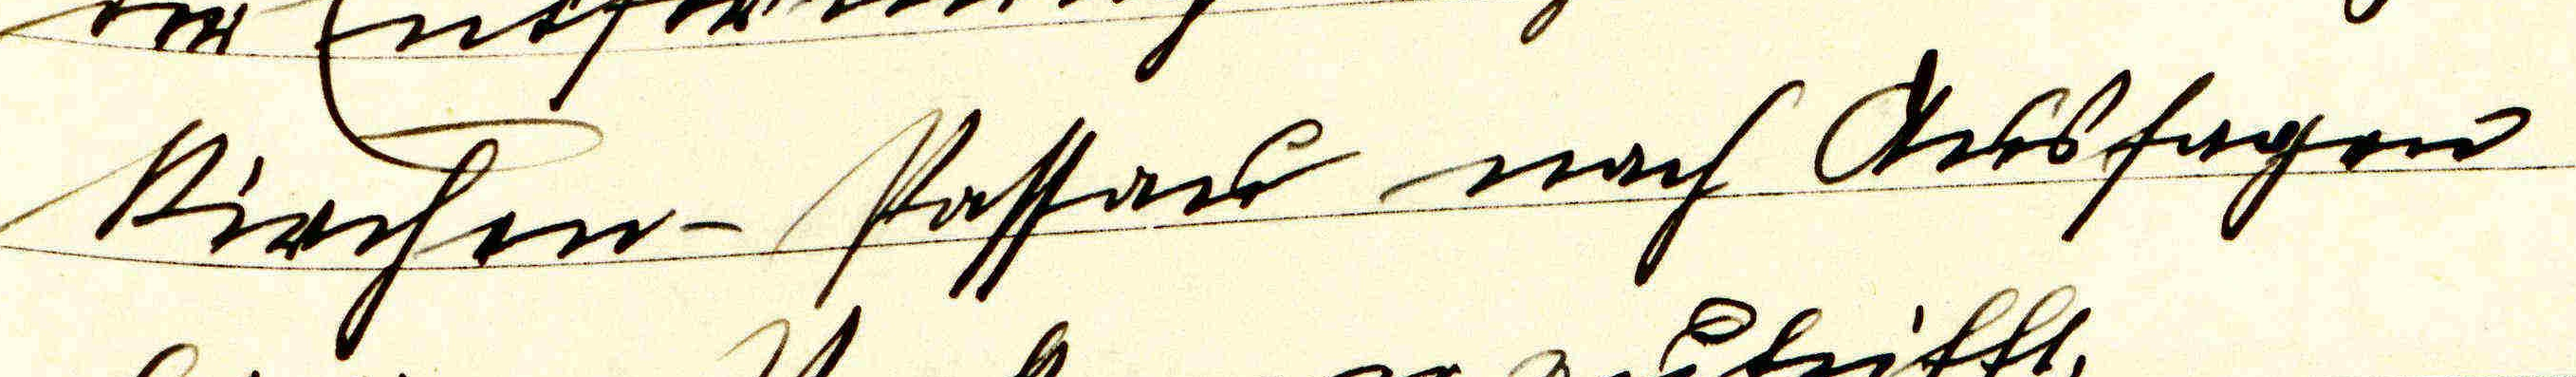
kirchen – Passau nah Aussagen
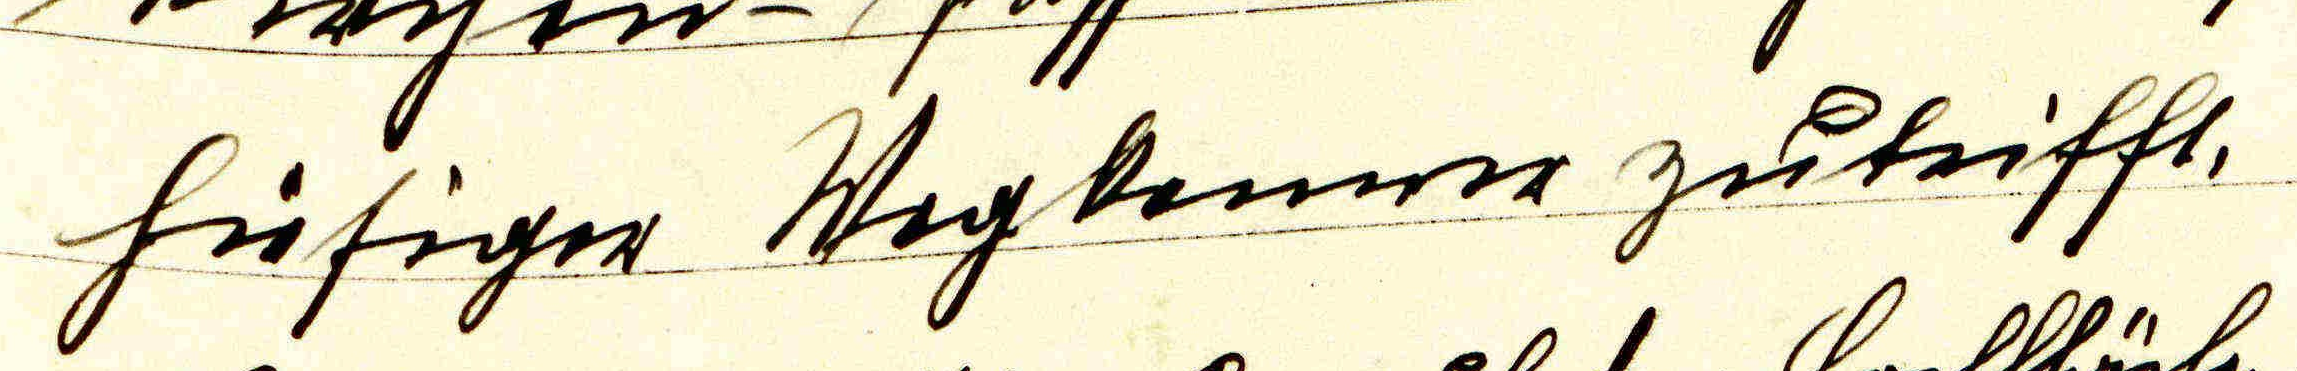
hiesiger Wegkenner zutrifft.
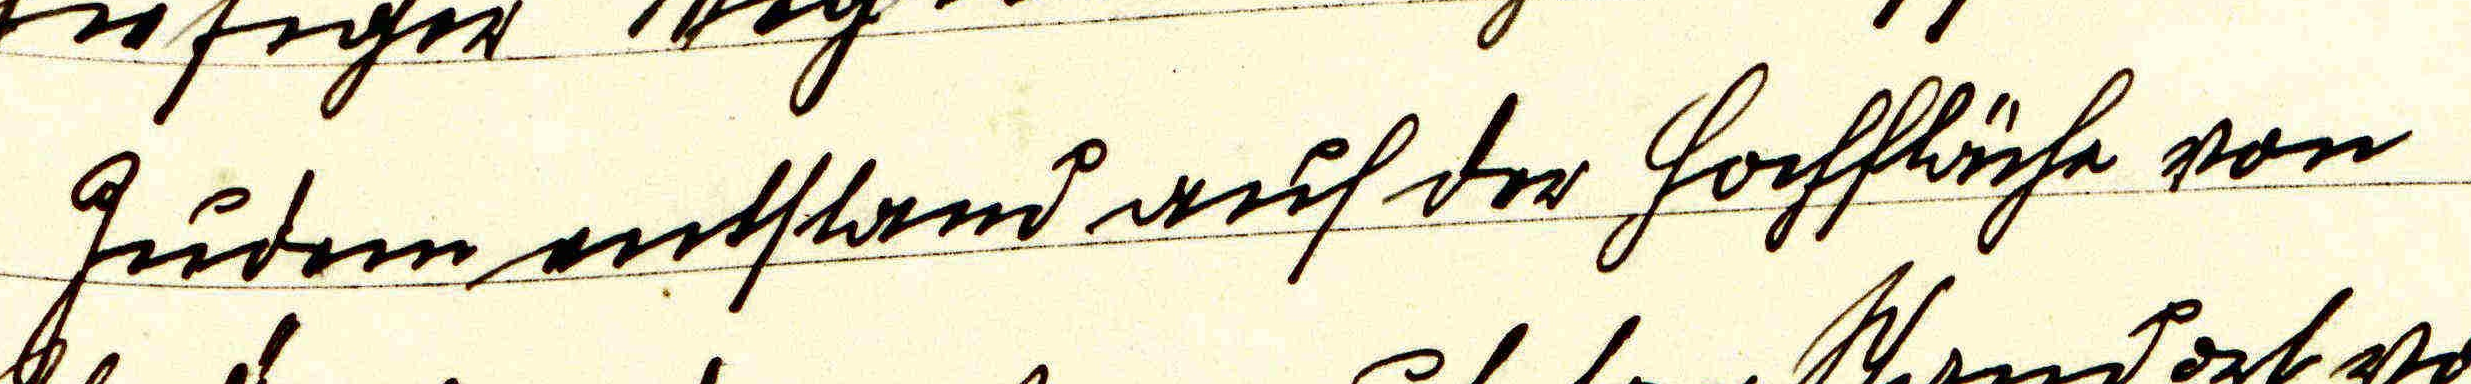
Zudem entstand auf der Hochfläche von
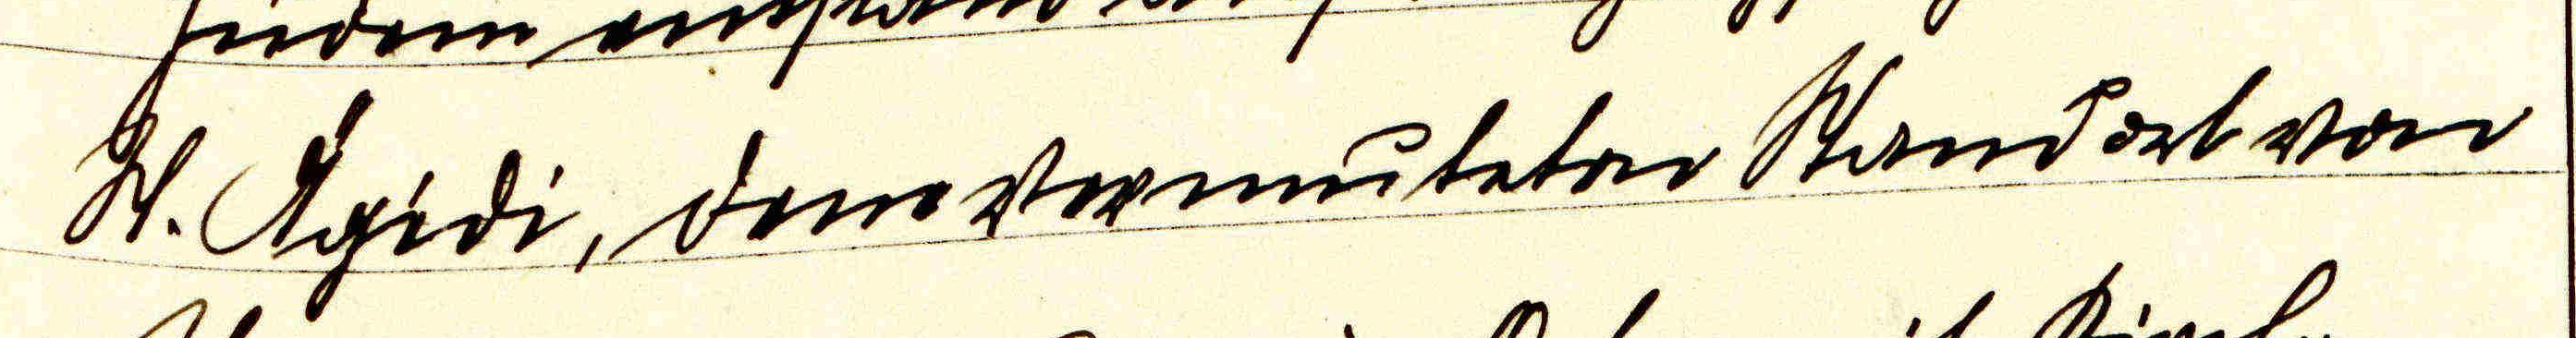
St. Ägidi, dem vermuteten Standort von
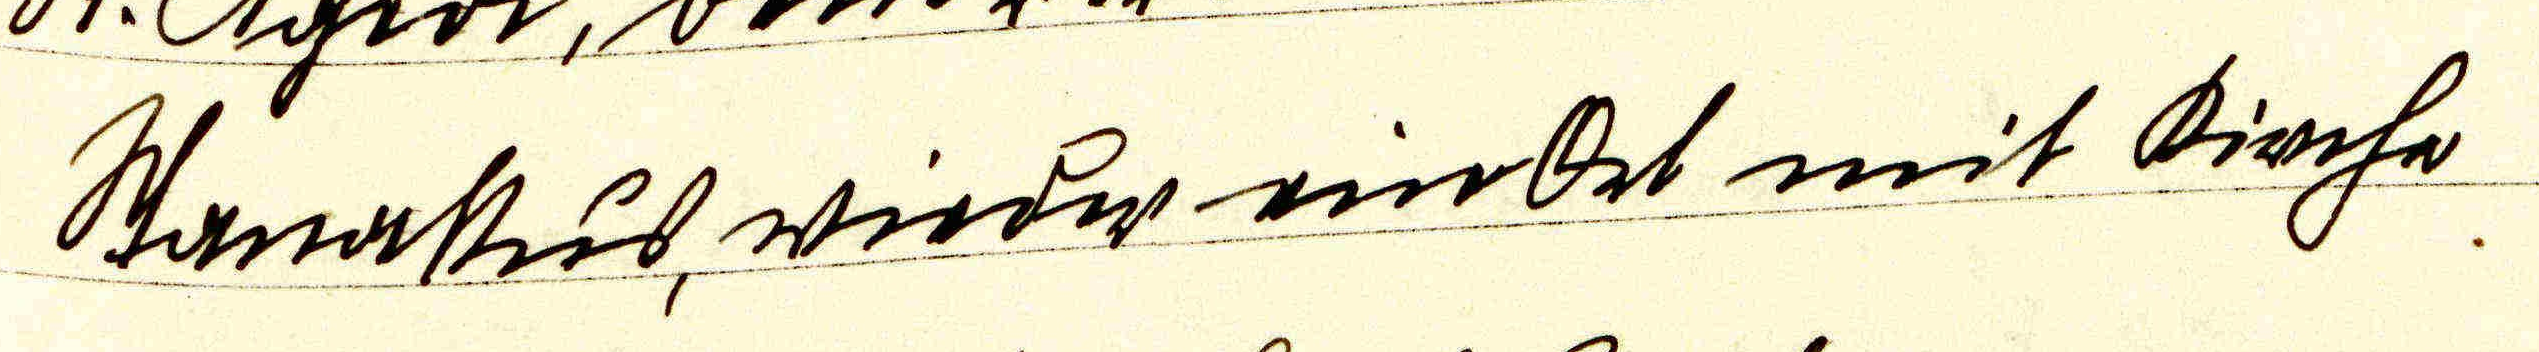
Stanakus, wieder ein Ort mit Kirche
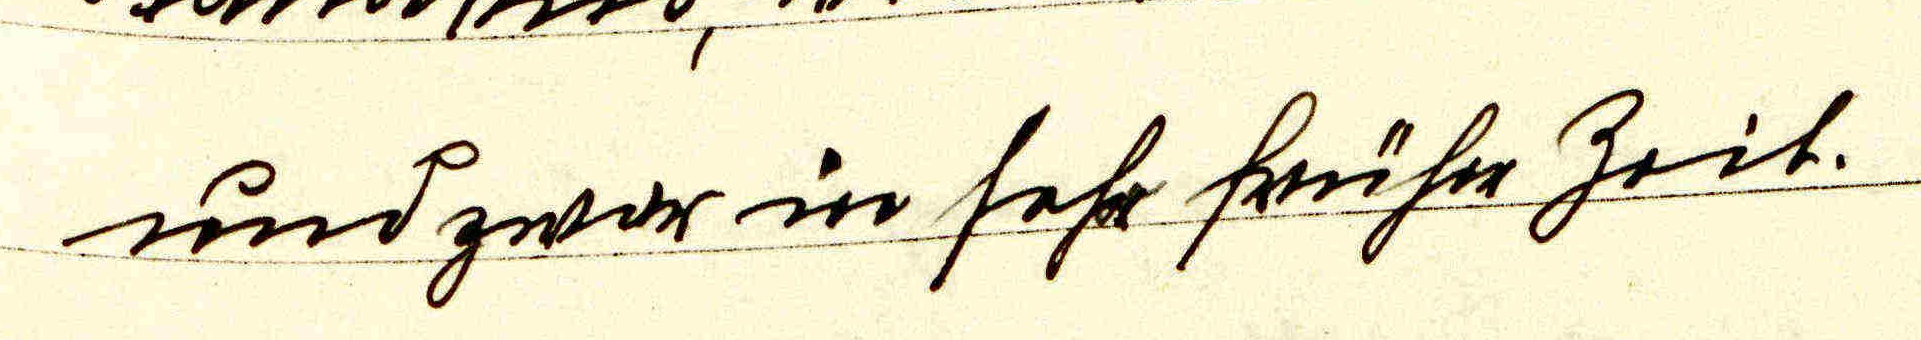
und zwar in sehr früher Zeit.
